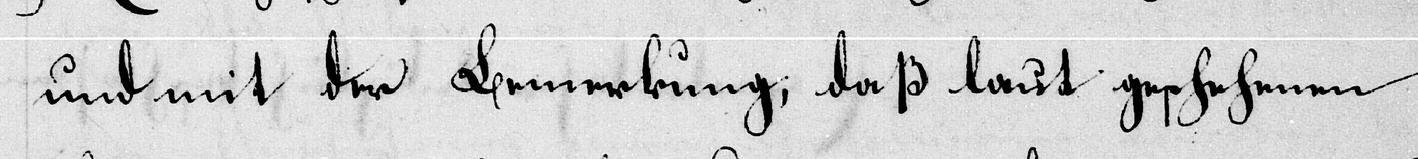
und mit der Bemerkung, daß laut geschehenen
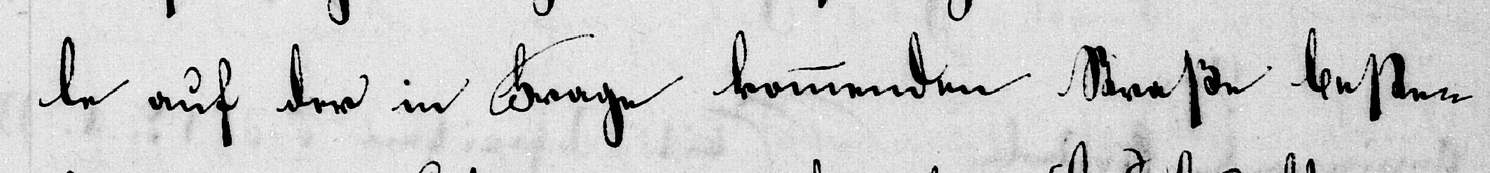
le auf der in Frage kommenden Straße beste¬
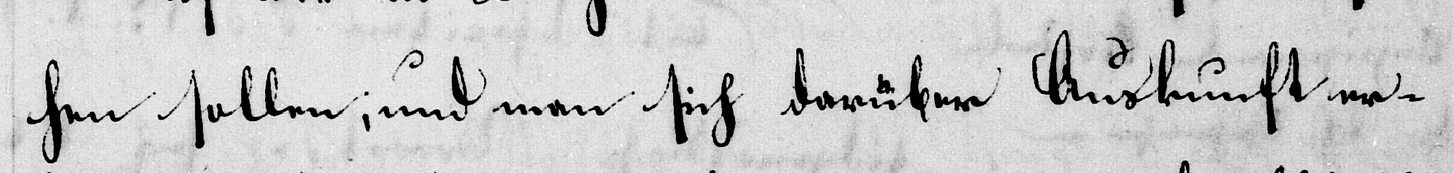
hen sollen; und man sich darüber Auskunft er¬
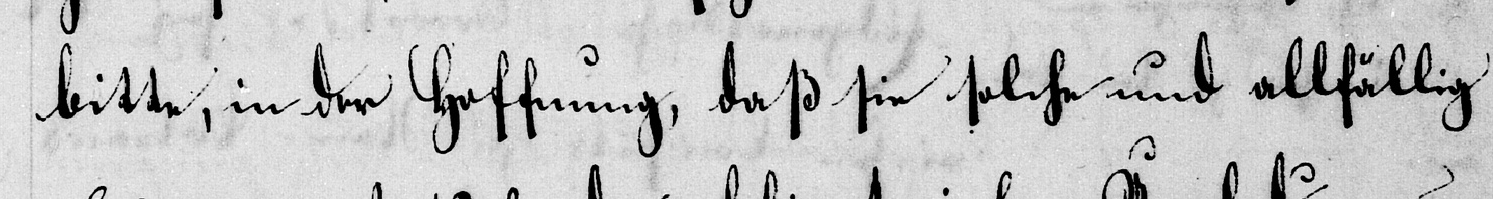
bitte, in der Hoffnung, daß sie solche und allfällig
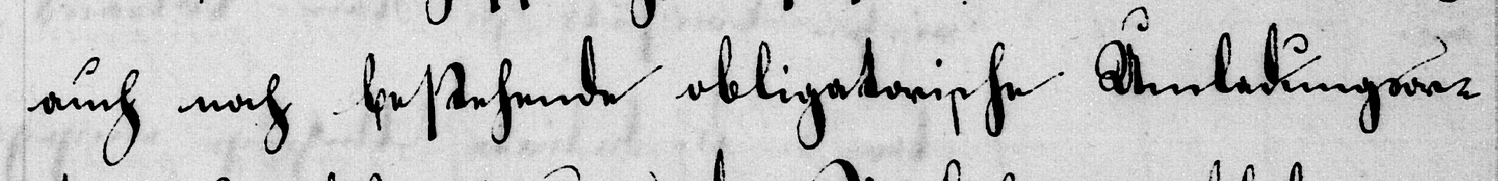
auch noch bestehende obligatorische Umladungsor¬
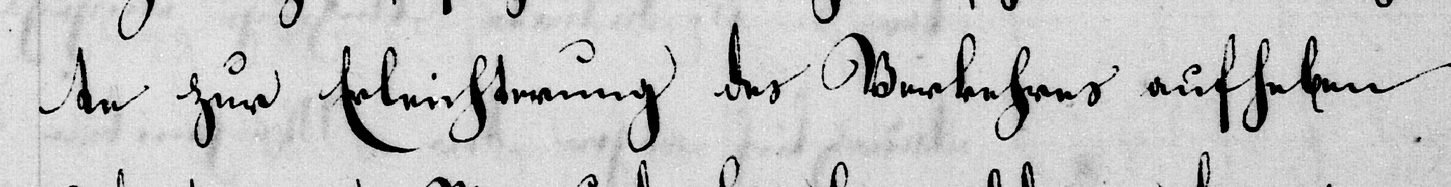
te zur Erleichterung des Verkehres aufheben
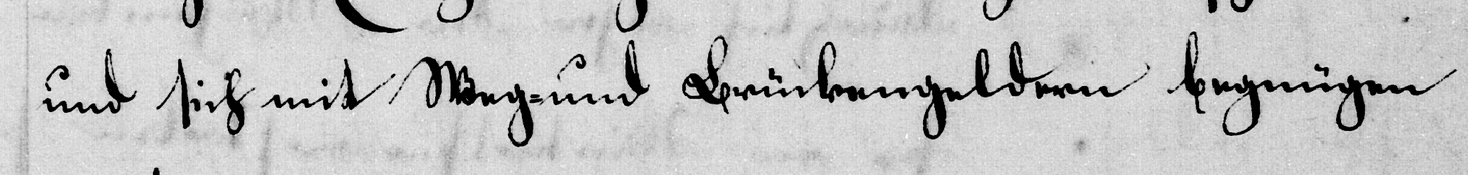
und sich mit Weg- und Brückengeldern begnügen
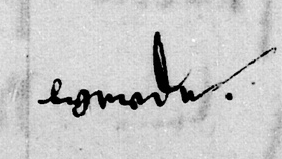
werde.
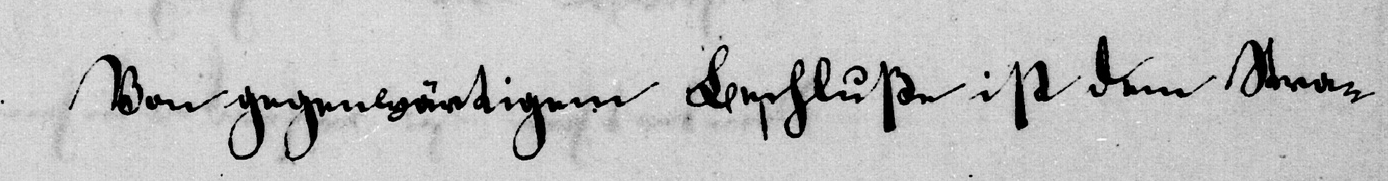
Von gegenwärtigem Beschluße ist dem Stra-
